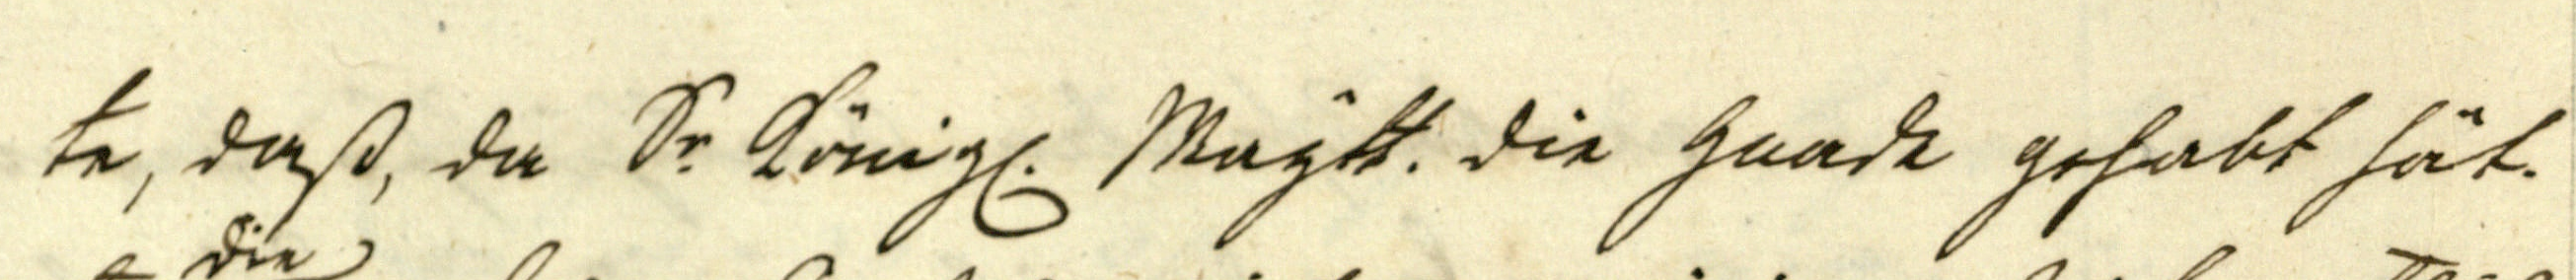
te, daß, da Sr Königl. Maÿtt. die Gnade gehabt hät¬
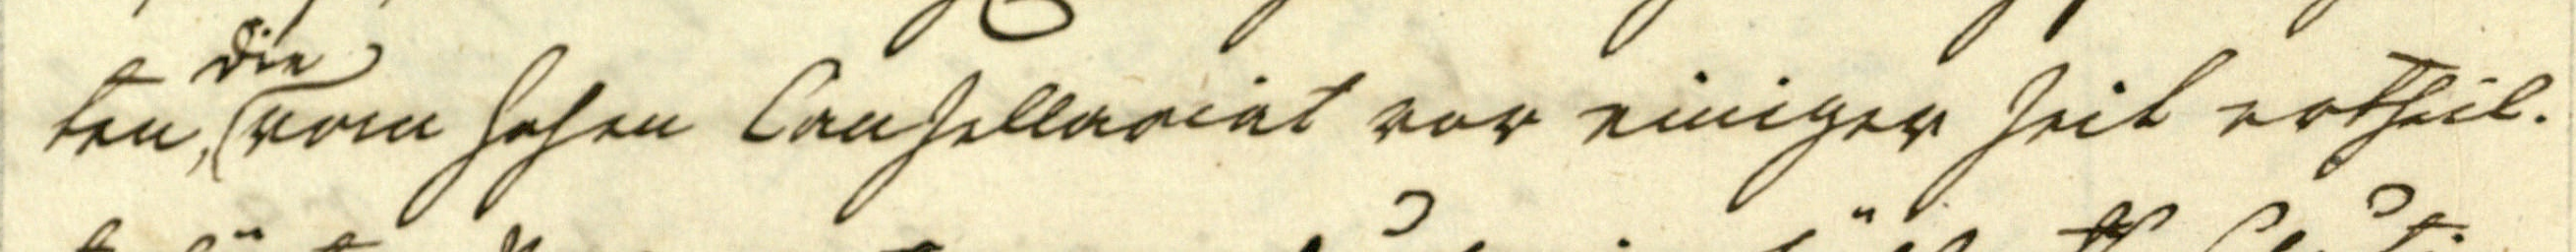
ten, die vom hohen Canzellariat vor einiger Zeit ertheil¬
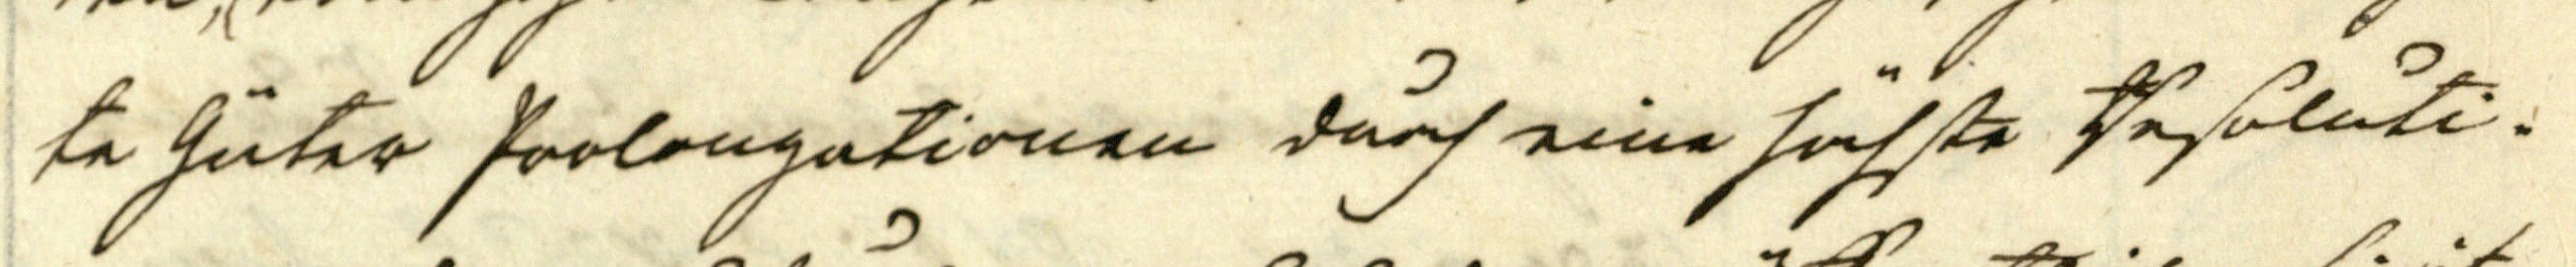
te Güter Prolongationen durch eine höchste Resoluti¬
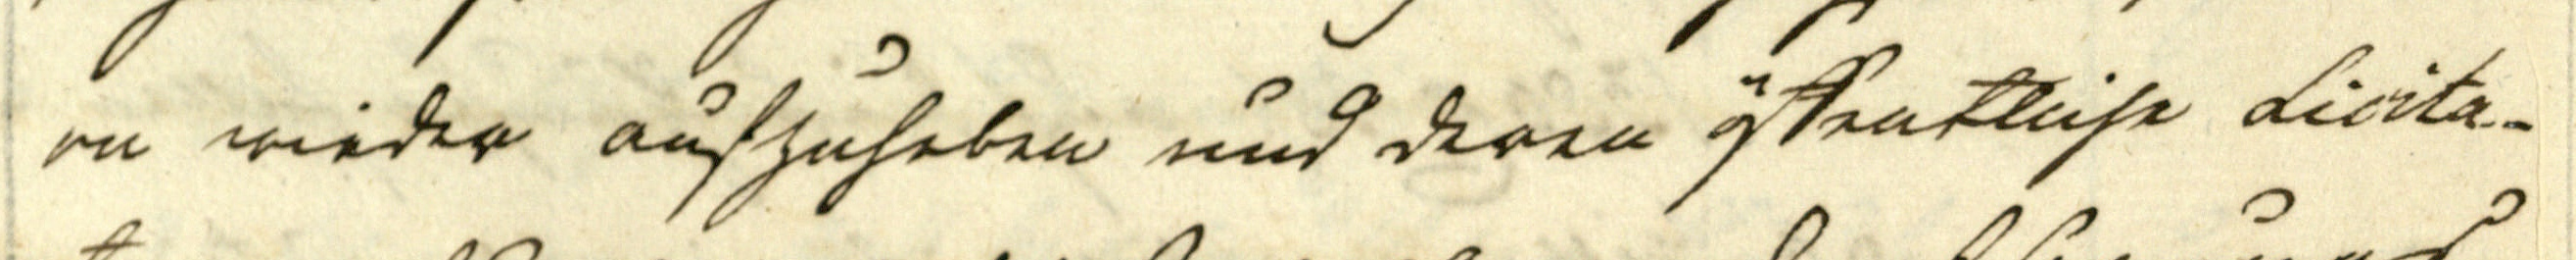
on wieder aufzuheben und deren öffentliche Licita¬
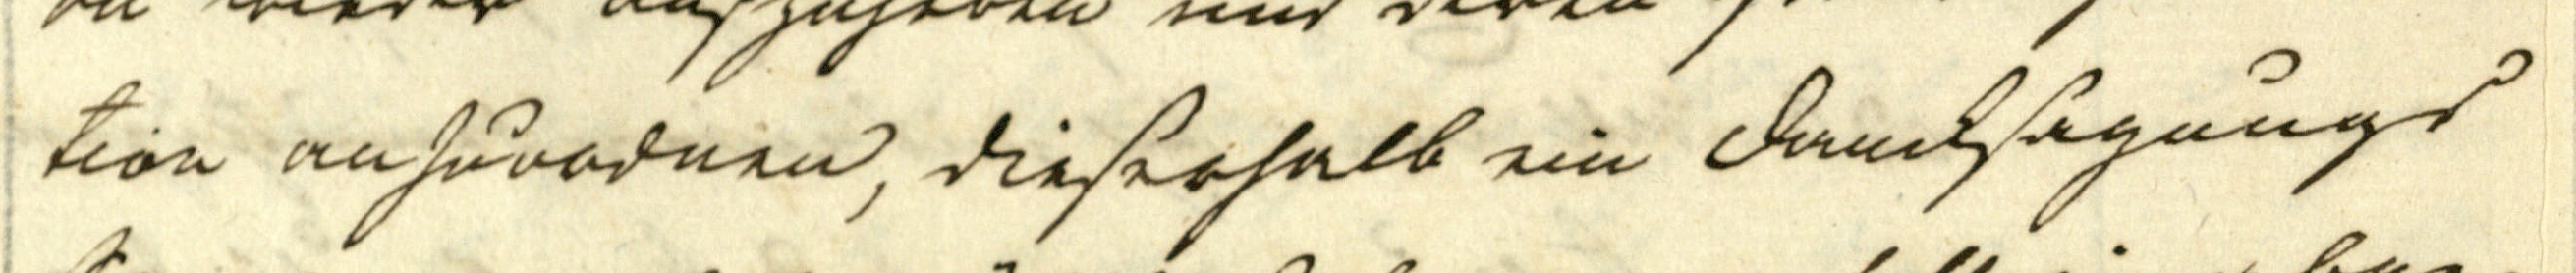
tion anzuordnen, dieserhalb ein Dancksagungs
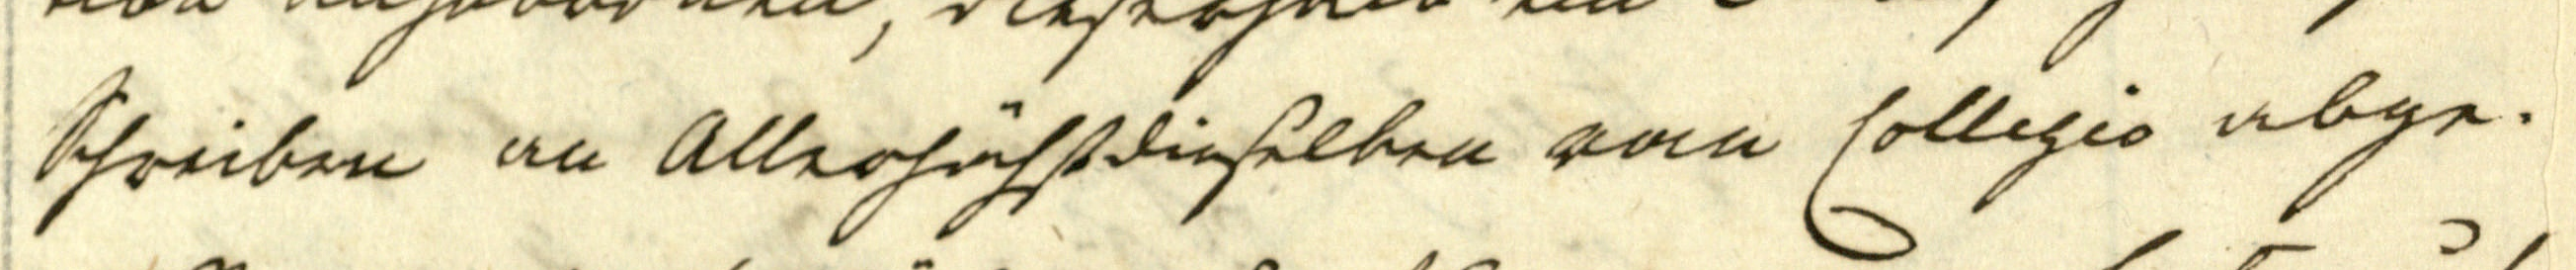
Schreiben an Allerhöchstdieselben vom Collegio abge¬
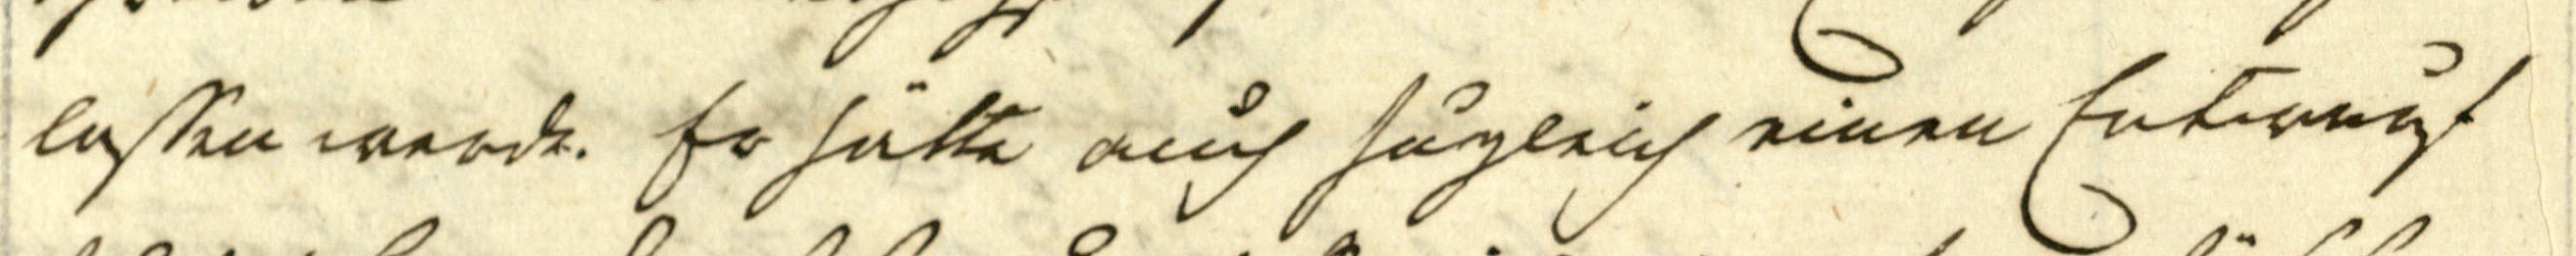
lassen werde. Er hätte auch zugleich einen Entwurf
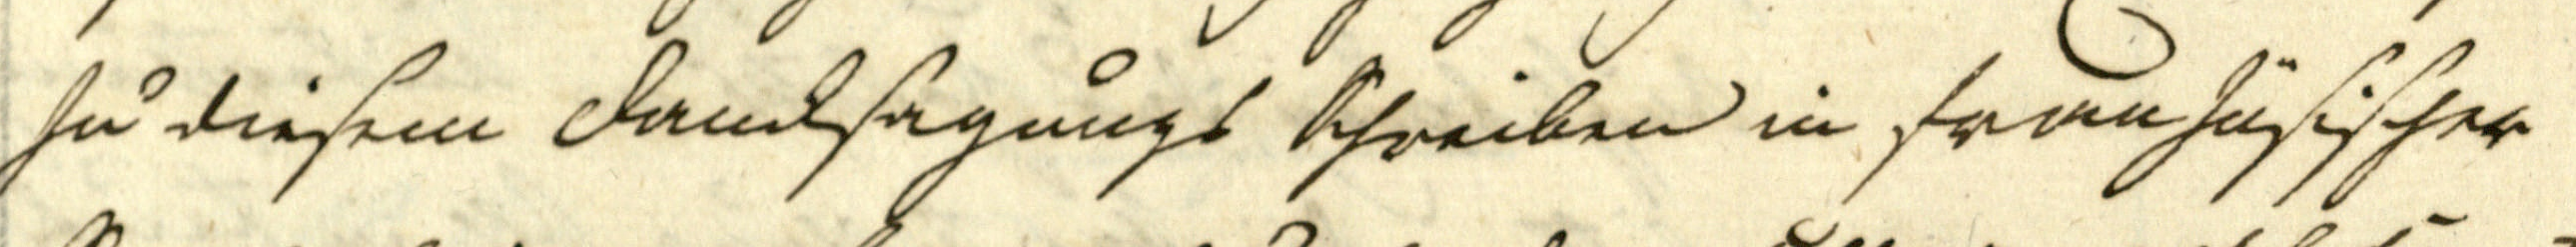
zu diesem Dancksagungs Schreiben in französischer
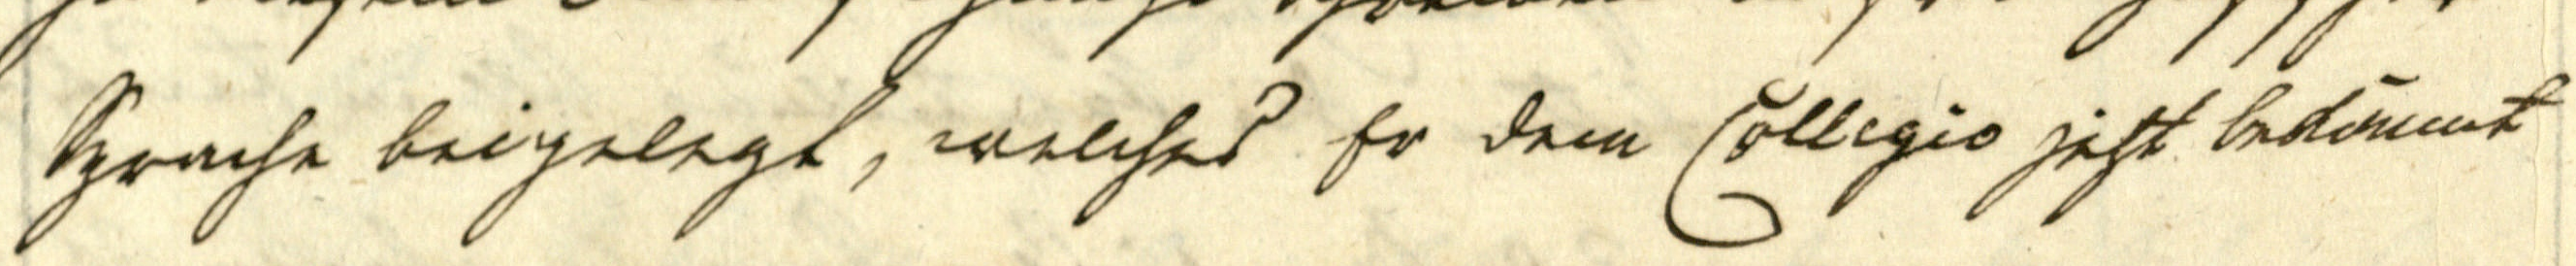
Sprache beigelegt, welches Er dem Collegio jetzt bekannt
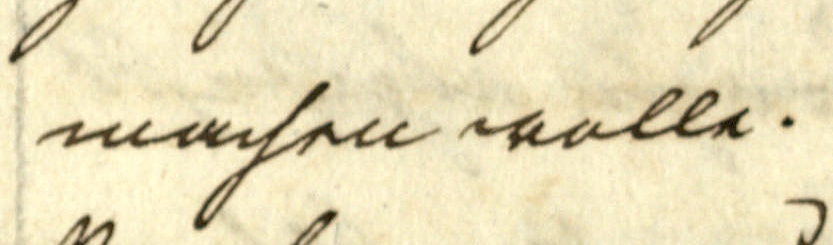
machen wolle.
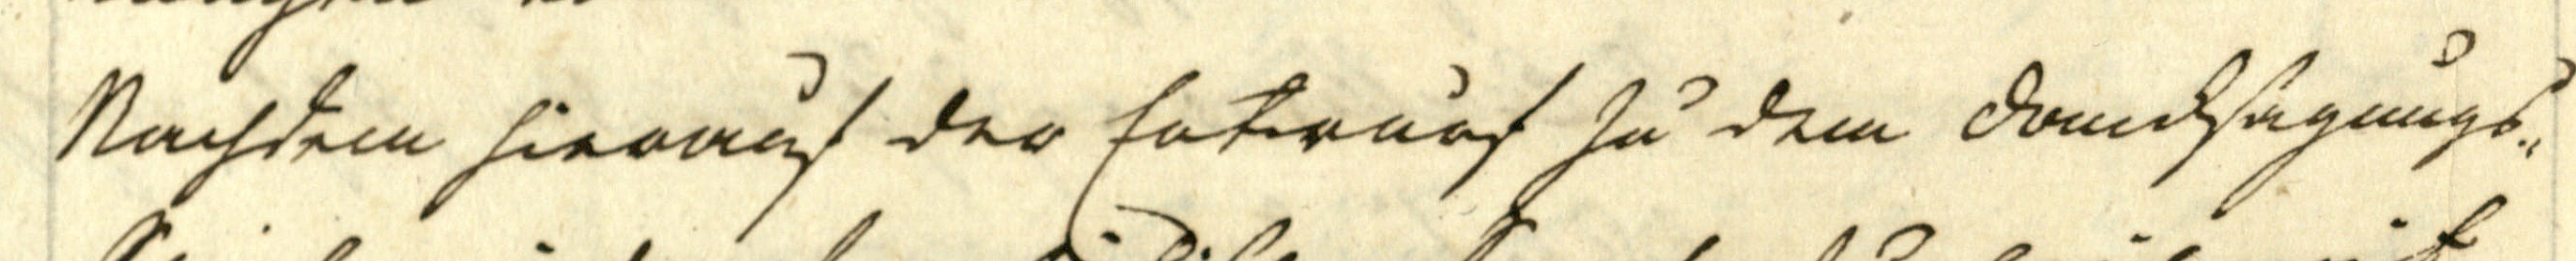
Nachdem hierauf der Entwurf zu dem Dancksagungs¬
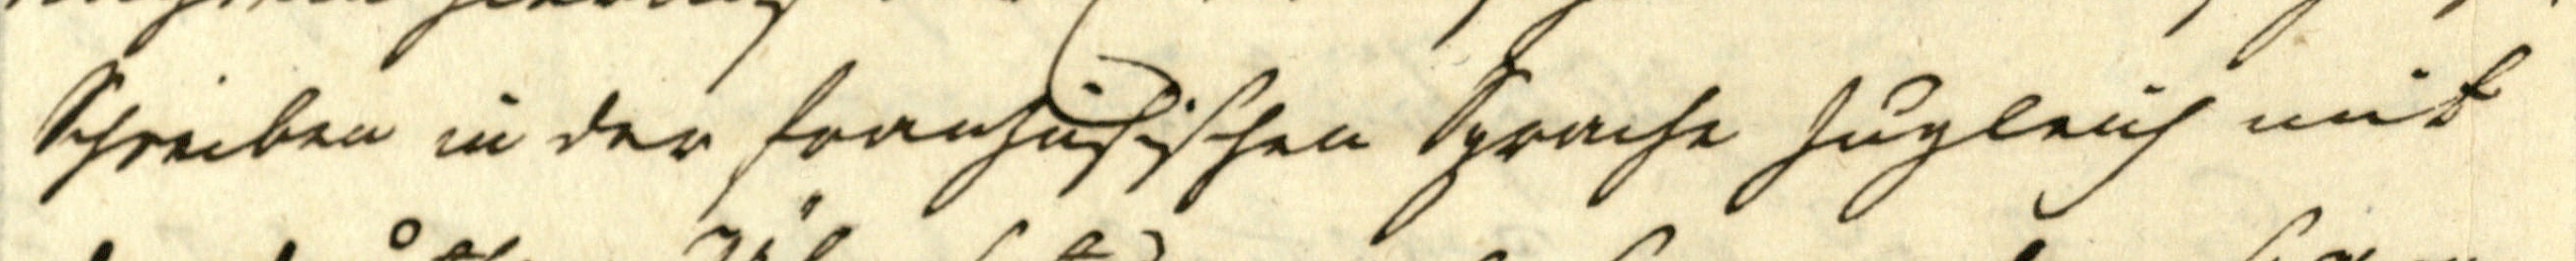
Schreiben in der französischen Sprache zugleich mit
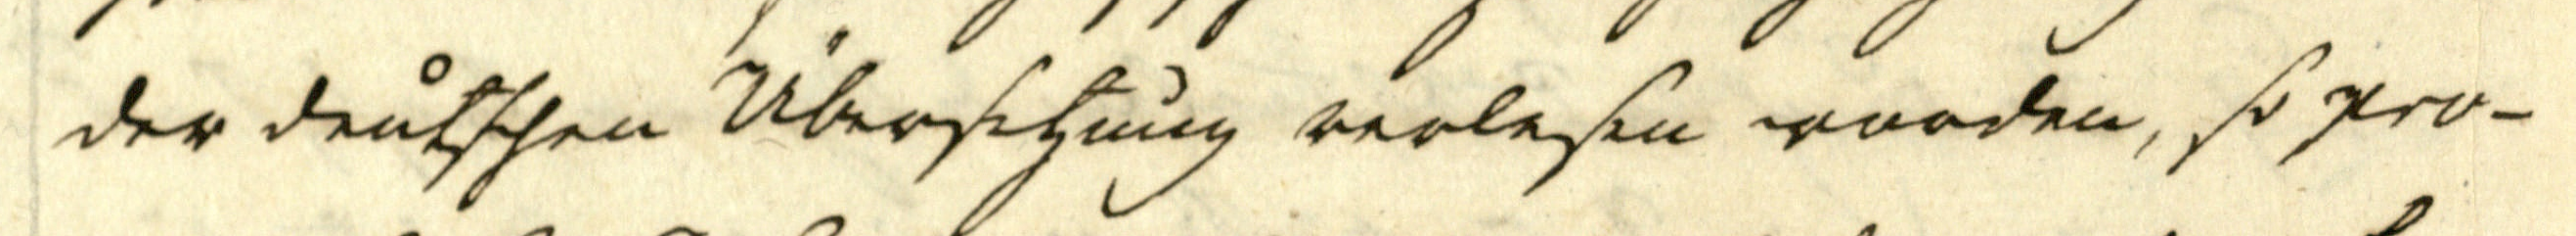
der deutschen Übersetzung verlesen worden, so pro¬
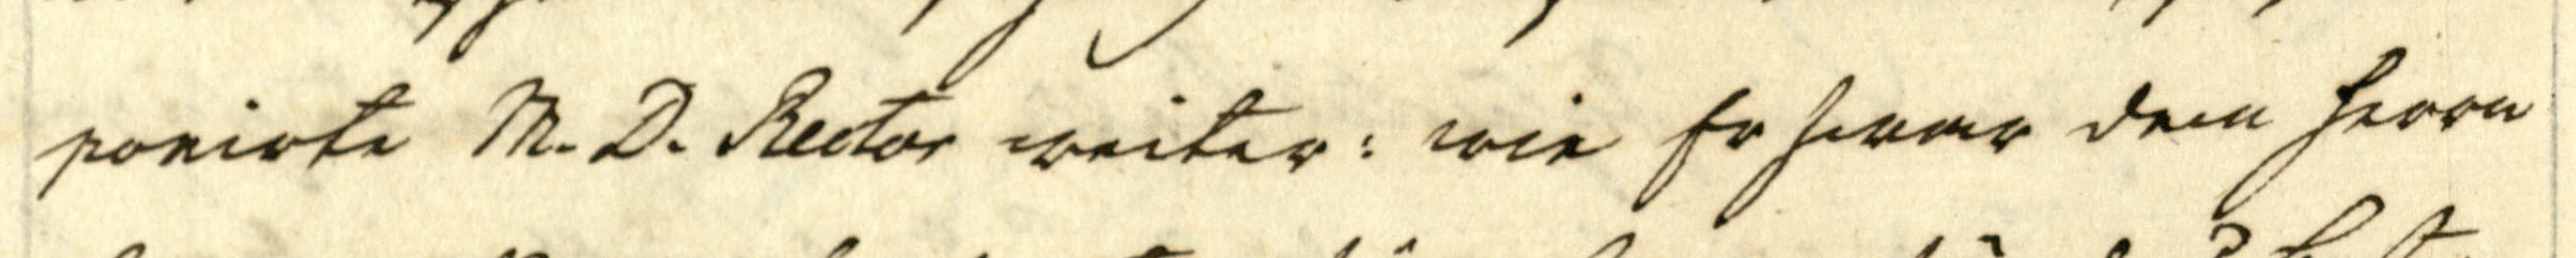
ponirte M. D. Rector weiter: wie Er zwar dem Herrn
